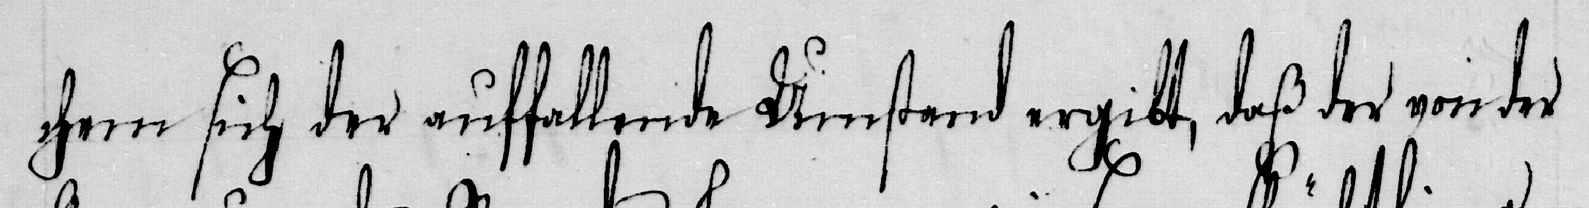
chem sich der auffallende Umstand ergibt, daß der von der
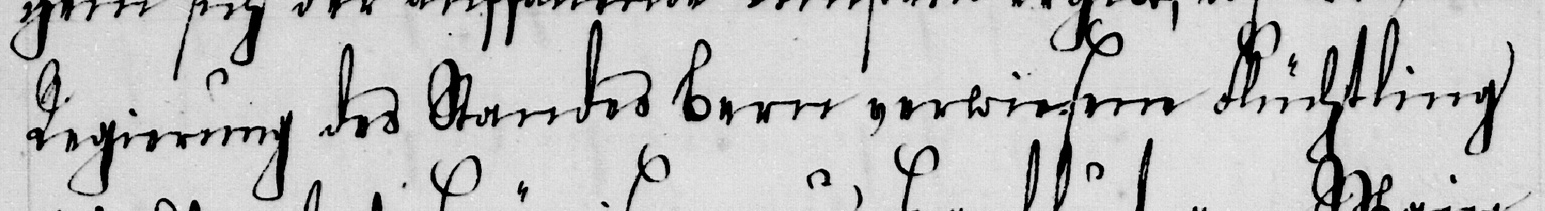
Regierung des Standes Bern verwiesene Flüchtling
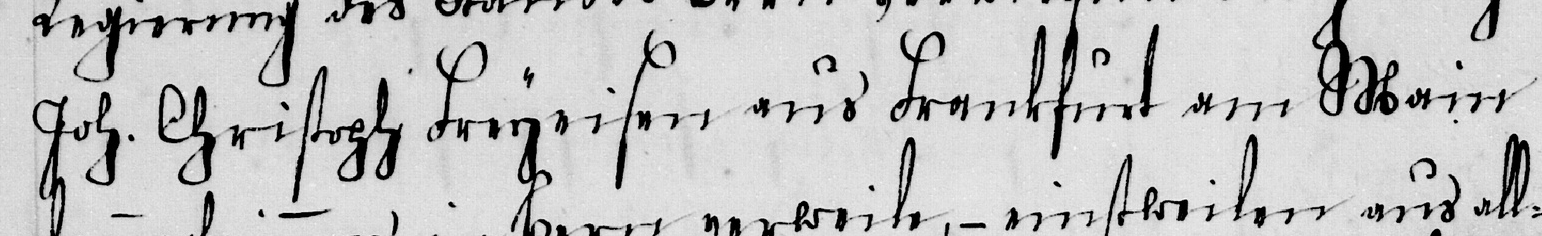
Joh. Christoph Freyeisen aus Frankfurt am Main
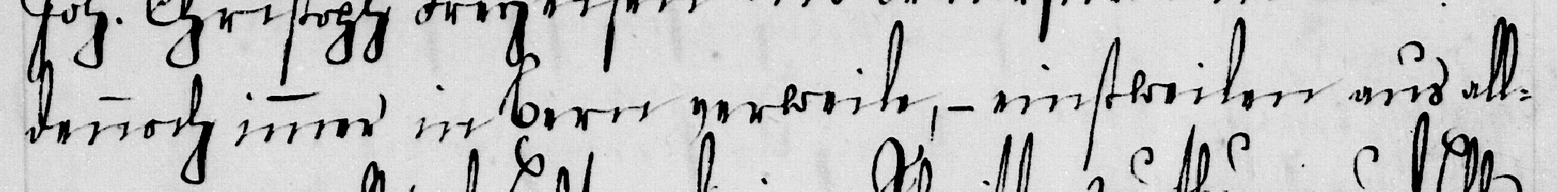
dennoch immer in Bern verweile, – einstweilen aus all¬
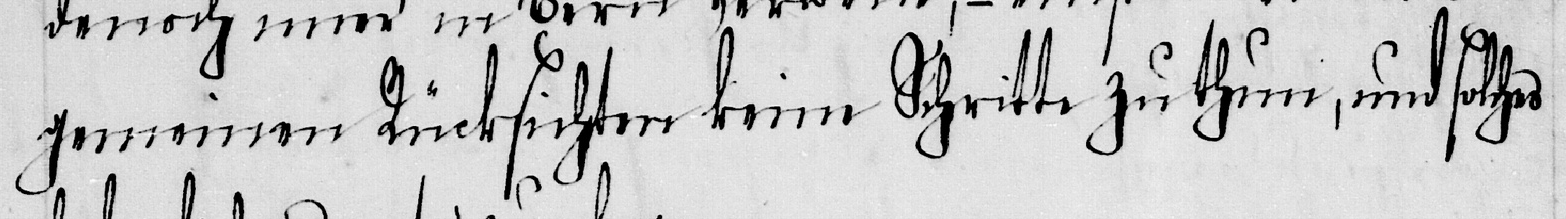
gemeinen Rücksichten keine Schritte zu thun, und solc¬
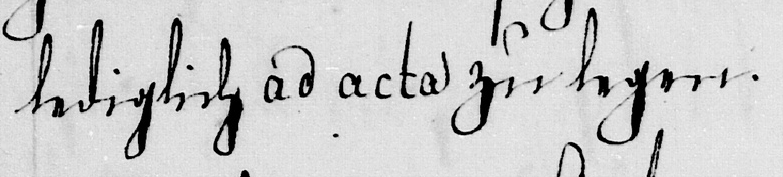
lediglich ad acta zu legen.
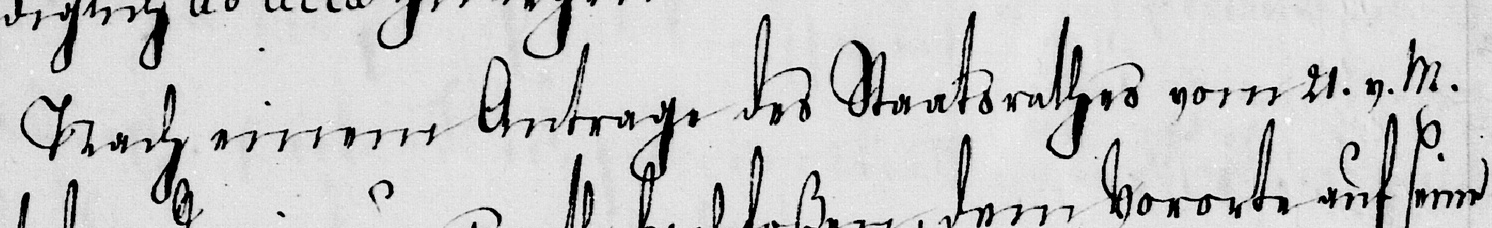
Nach einem Antrage des Staatsrathes vom 21. v. M.
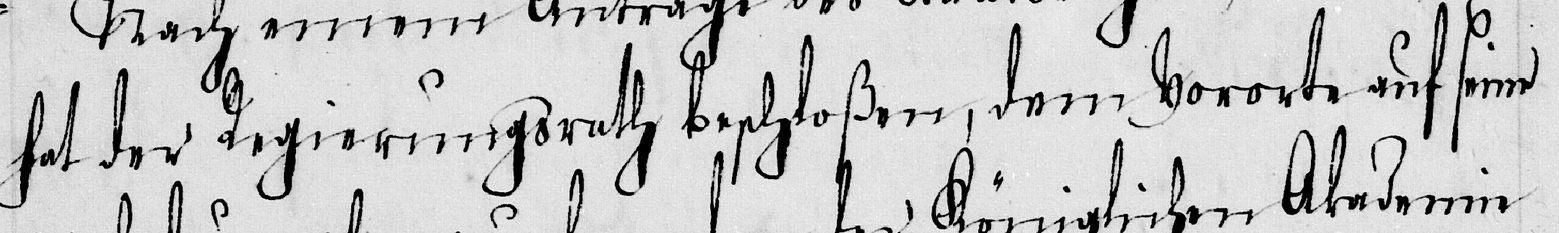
hat der Regierungsrath beschloßen, dem Vororte auf seine
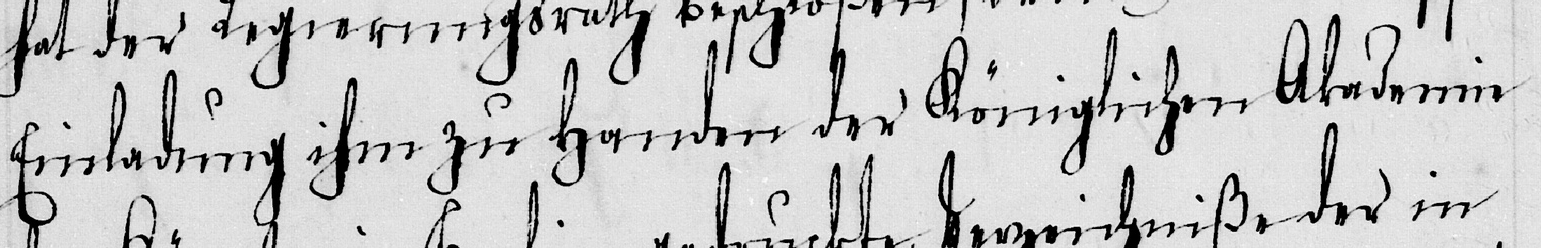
Einladung ihm zu Handen der Königlichen Akademie
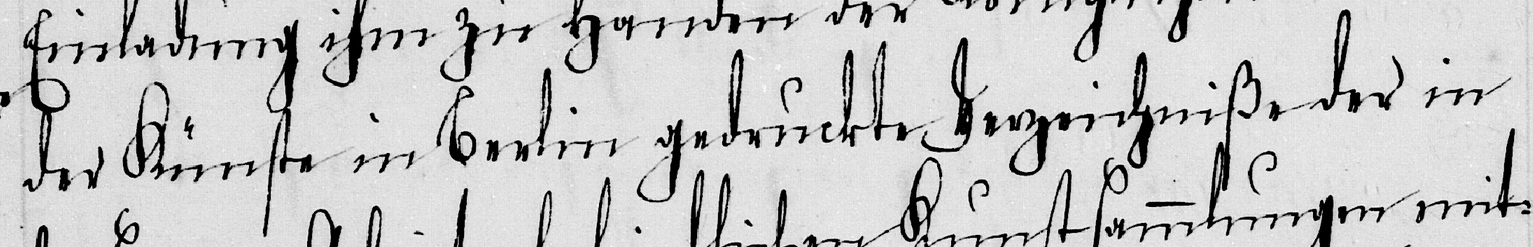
der Künste in Berlin gedruckte Verzeichniße der in
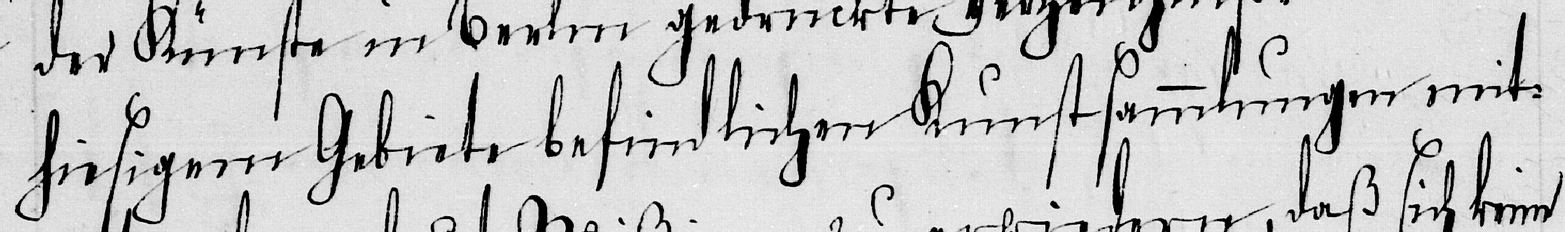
hiesigem Gebiete befindlichen Kunstsammlungen mit¬
